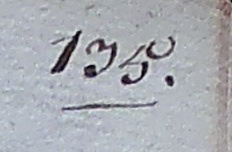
135.
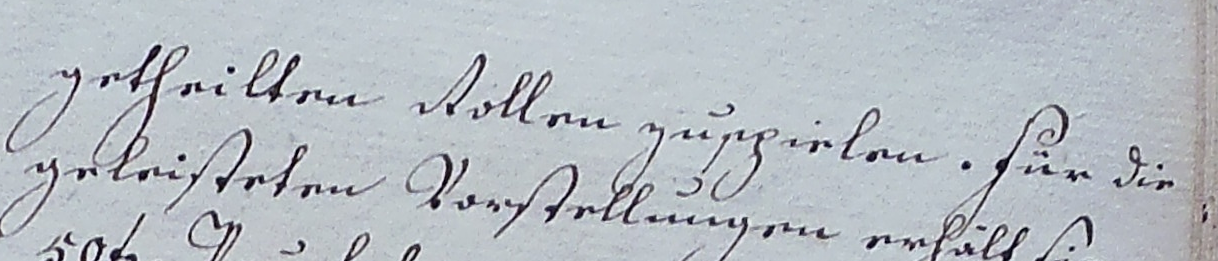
getheilten Rollen zuspielen. Für die¬
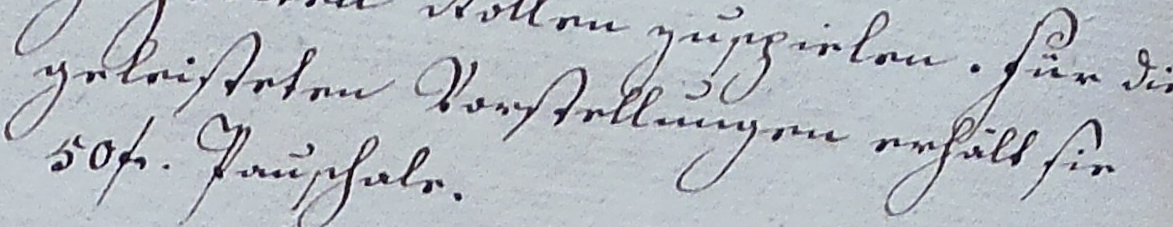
geleisteten Vorstellungen erhält sie
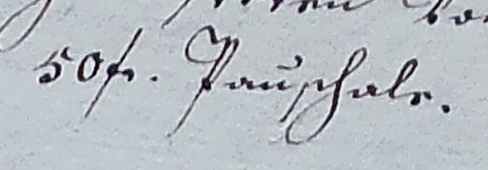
50fr. Pauschale.
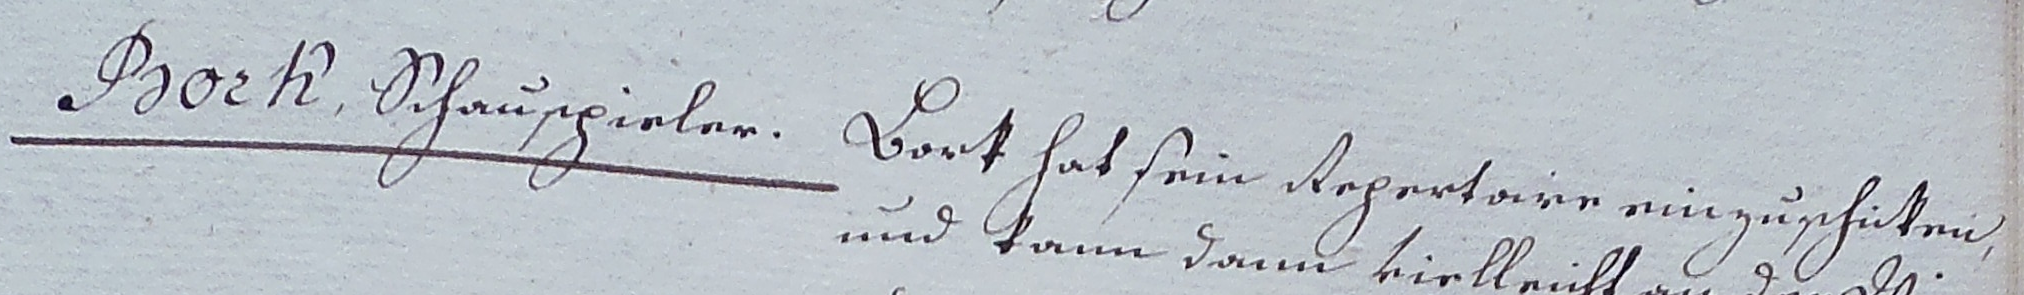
Bork, Schauspieler. Bork hat sein Repertoire einzuschicken,
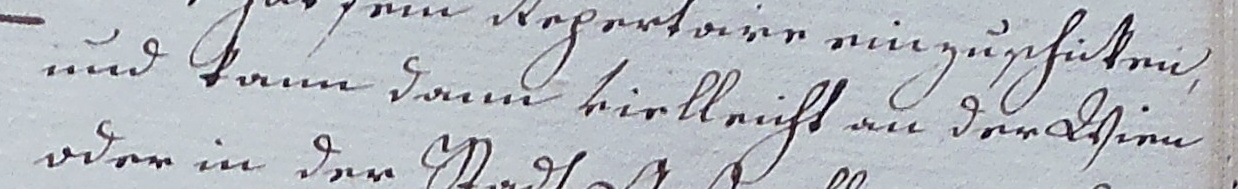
und kann dann vielleicht an der Wien
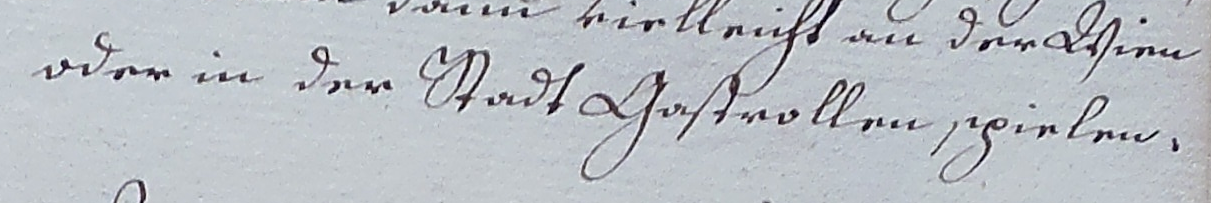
oder in der Stadt Gastrollen spielen.
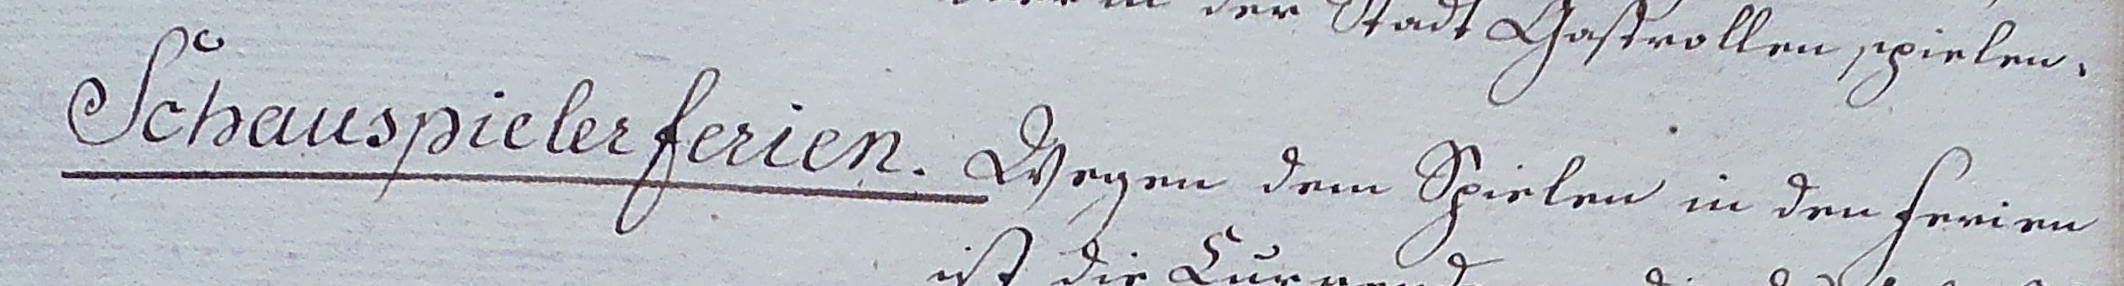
Schauspielerferien. Wegen dem Spielen in den Ferien
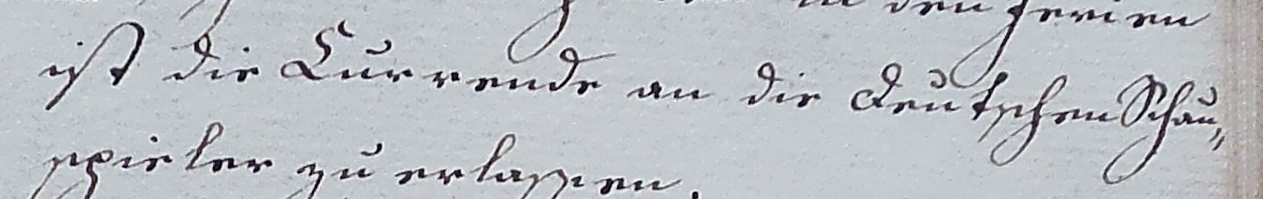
ist die Currende an die Deutschen Schau¬
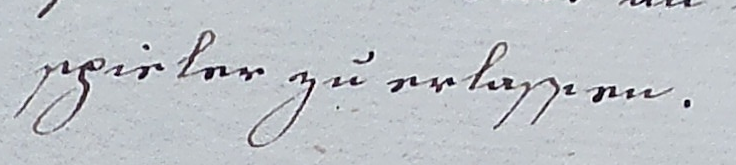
spieler zu erlassen.
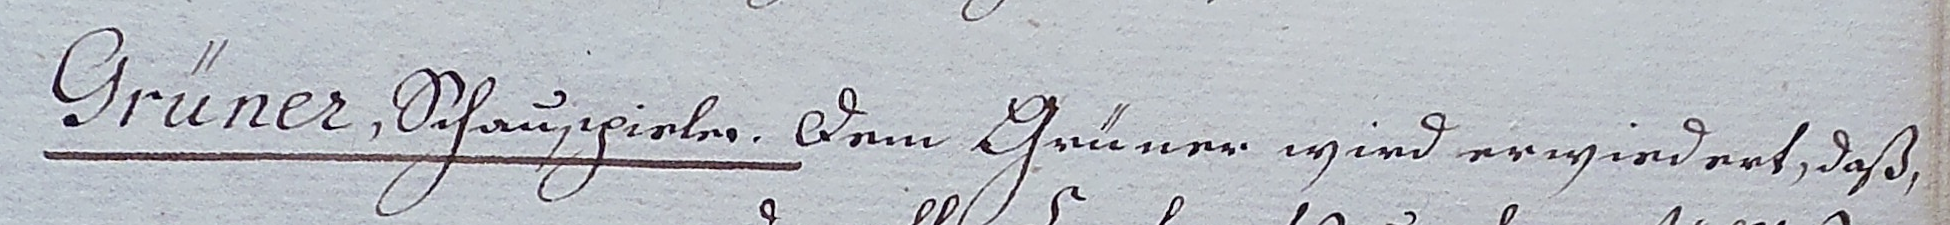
Grüner, Schauspieler. Dem Grüner wird erwiedert, daß,
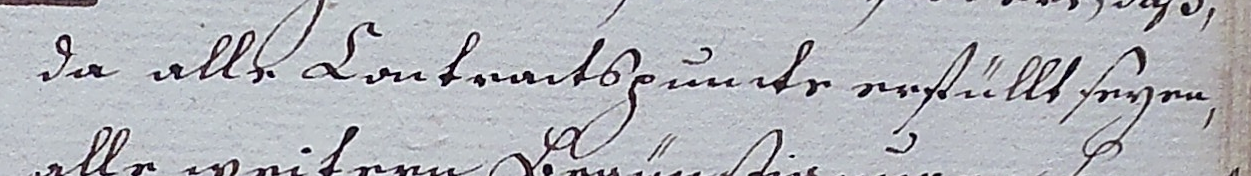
da alle Contractspuncte erfüllt seyen,
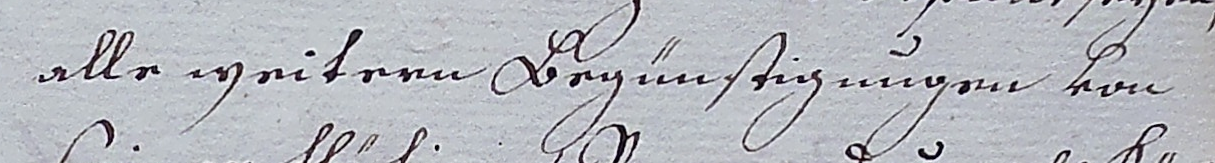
alle weitern Begünstigungen von
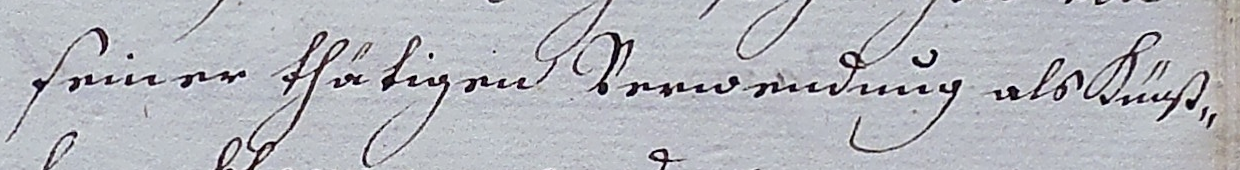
seiner thätigen Verwendung als Künst¬
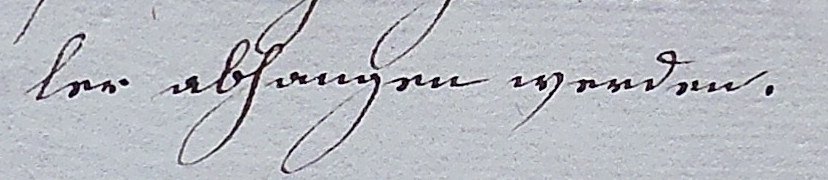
ler abhangen werden.
